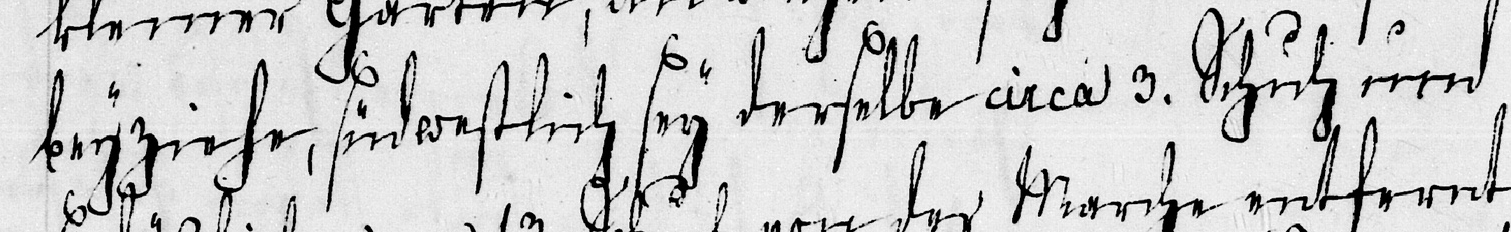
beyziehe, südwestlich sey derselbe circa 3. Schuh und
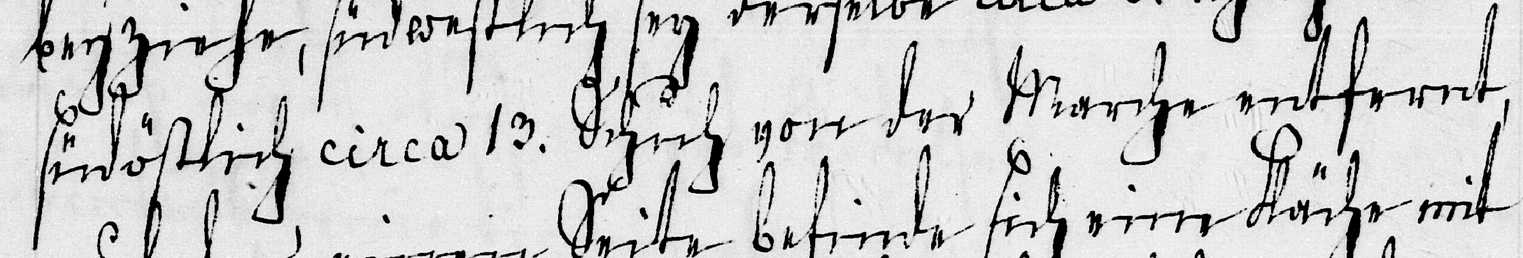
südöstlich circa 13. Schuh von der Marche entfernt,
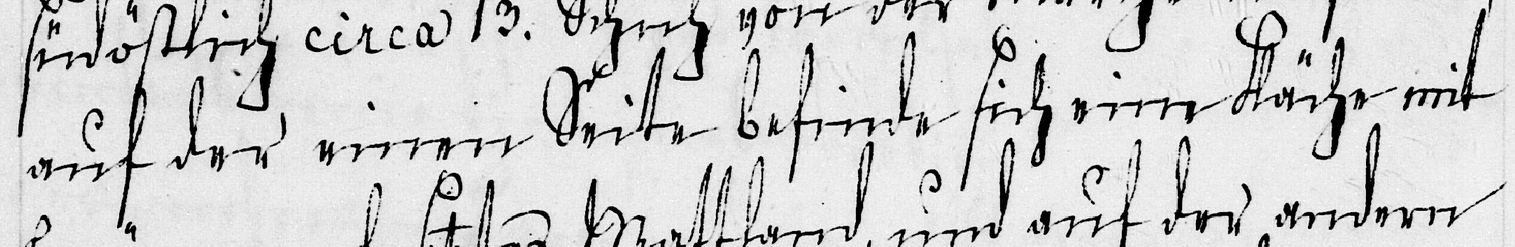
auf der einen Seite befinde sich eine Fläche mit
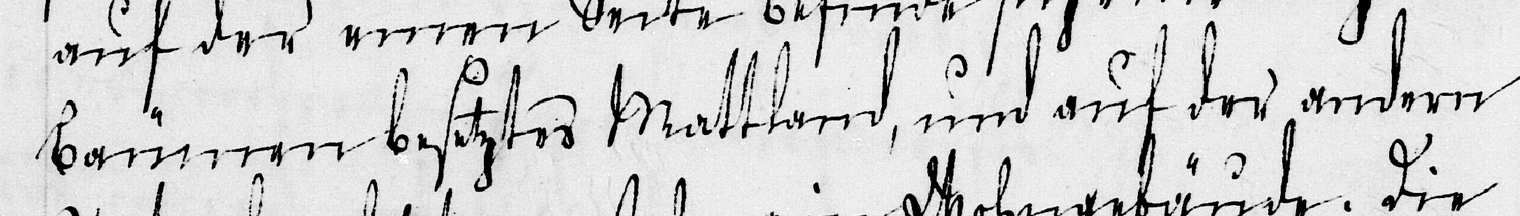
Bäumen besetztes Mattland, und auf der andern
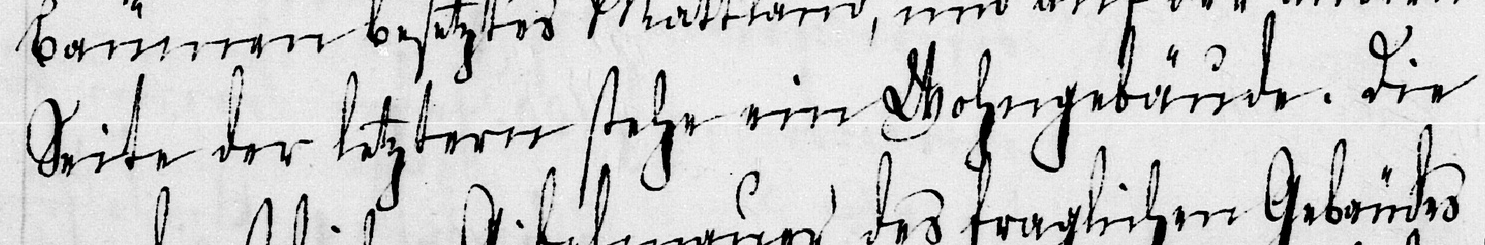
Seite der letztern stehe ein ein Wohngebäude. Die
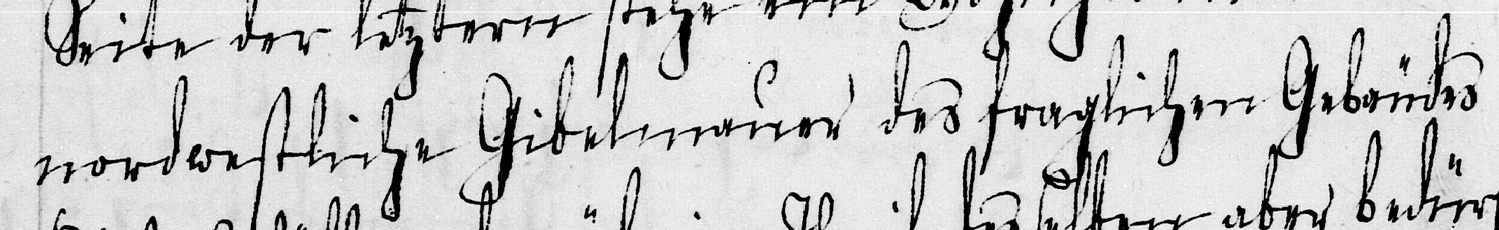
nordwestliche Gibelmauer des fraglichen Gebäudes
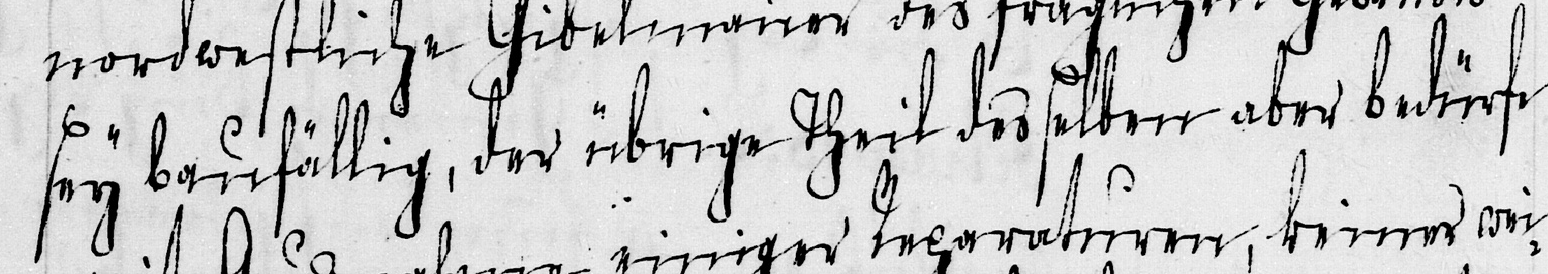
sey baufällig, der übrige Theil desselben aber bedürfe
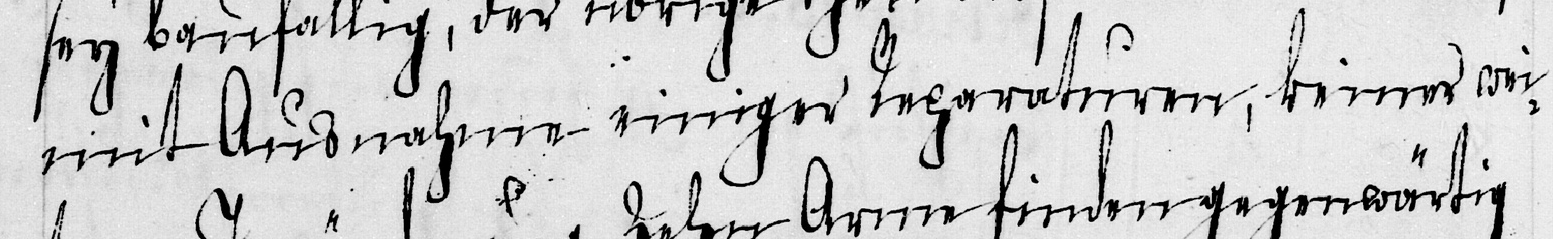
mit Ausnahme einiger Reparaturen, keiner wei¬
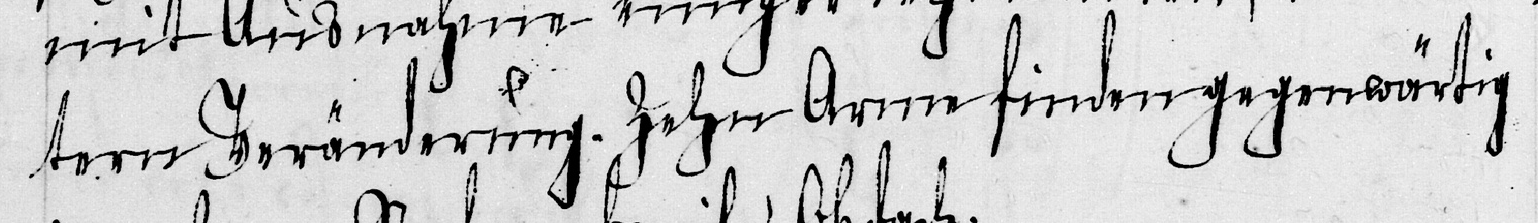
tern Veränderung. Zehn Arme finden gegenwärtig
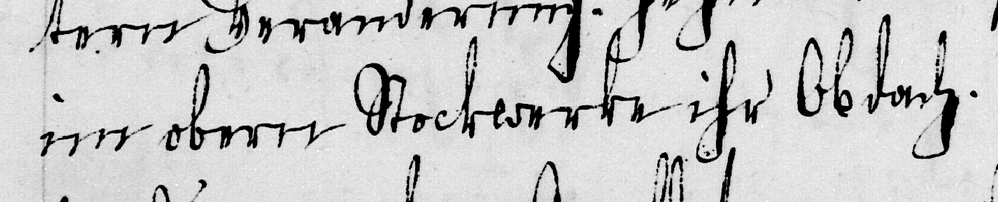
im obern Stockwerke ihr Obdach.
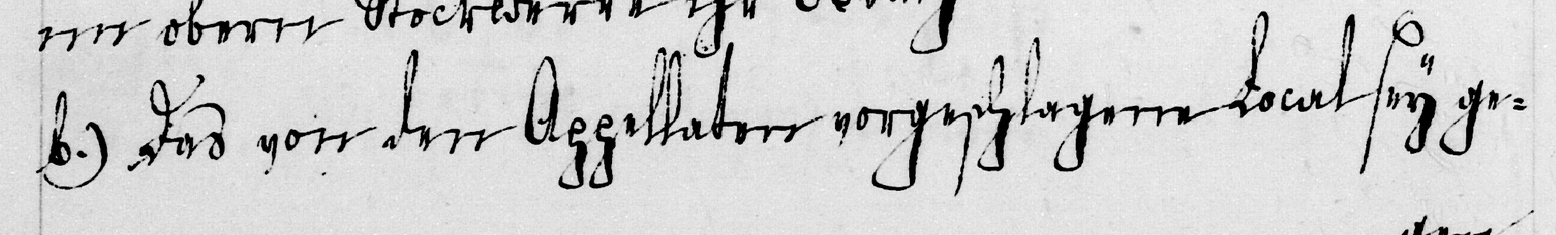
b.) Das von den Appellanten vorgeschlagene Local sey ge-
